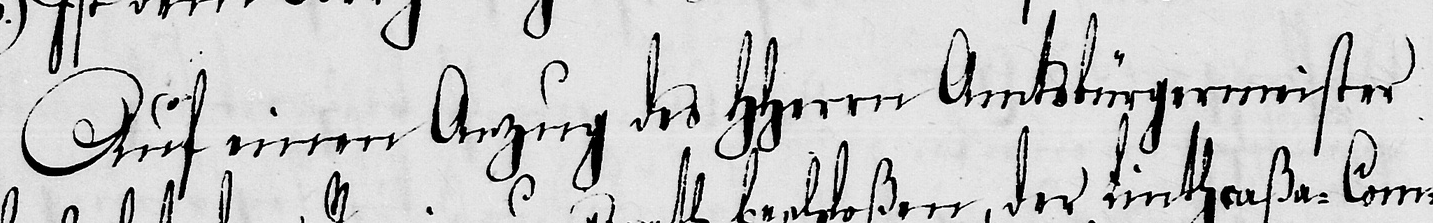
Auf einen Anzug des HHerrn Amtsbürgermeister
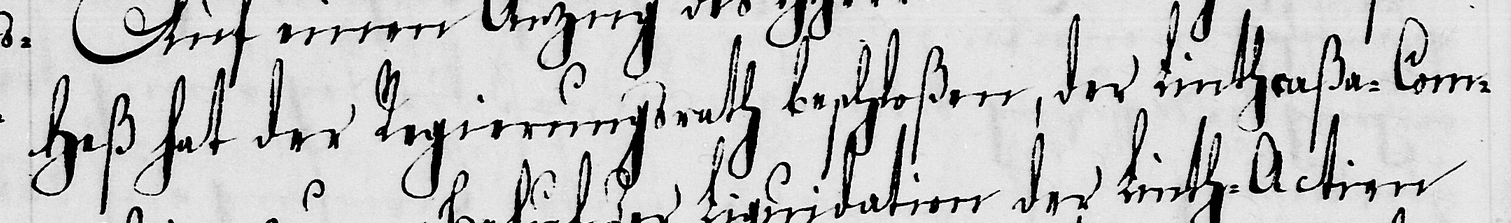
Heß hat der Regierungsrath beschloßen, der Linthcaßa-Com¬
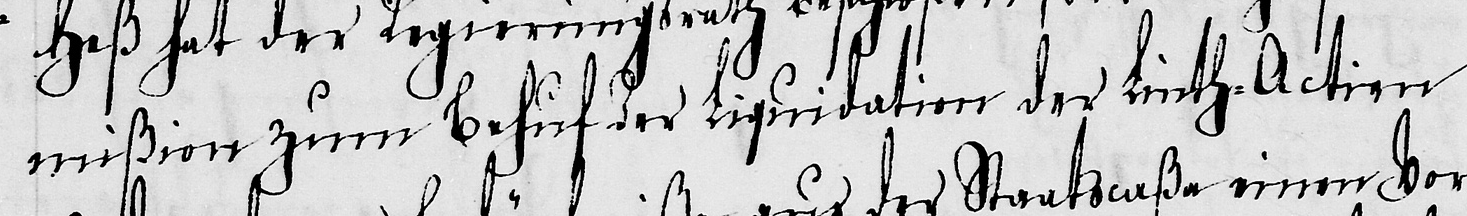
mißion zum Behuf der Liquidation der Linth-Actien
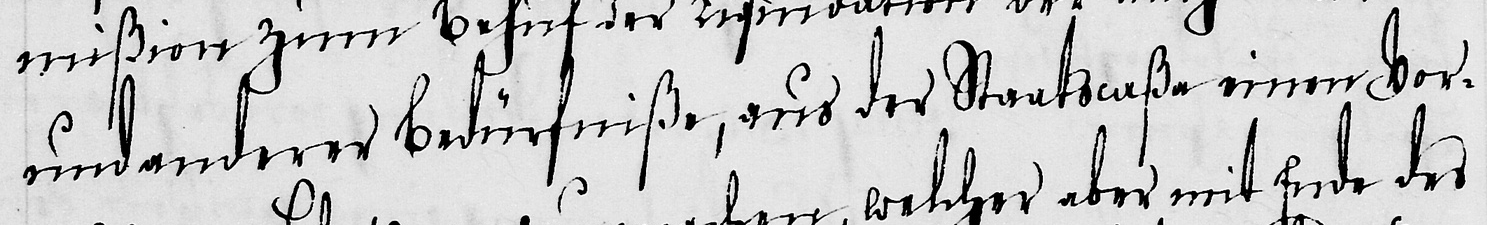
und anderer Bedürfniße, aus der Staatscaßa einen Vor¬
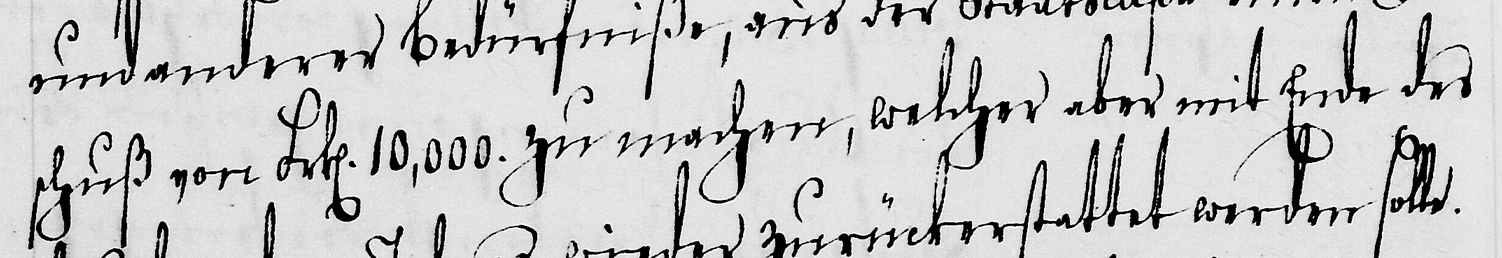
schuß von Frk[en]. 10,000. zu machen, welcher aber mit Ende des
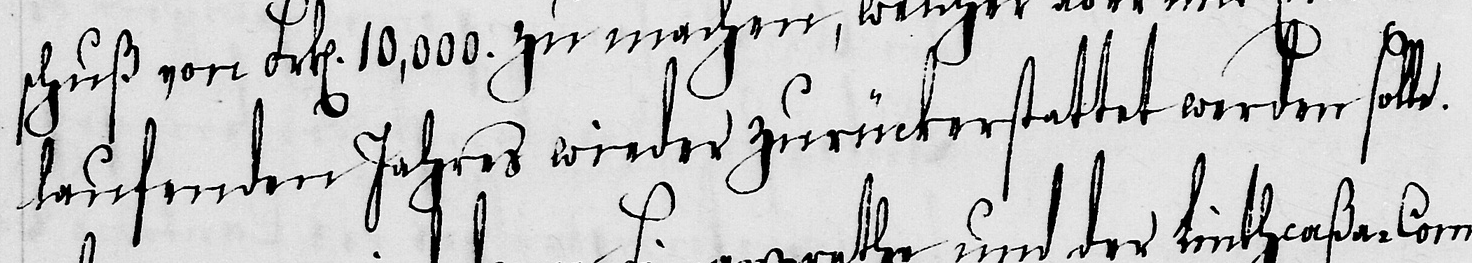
laufenden Jahres wieder zurückerstattet werden sol¬
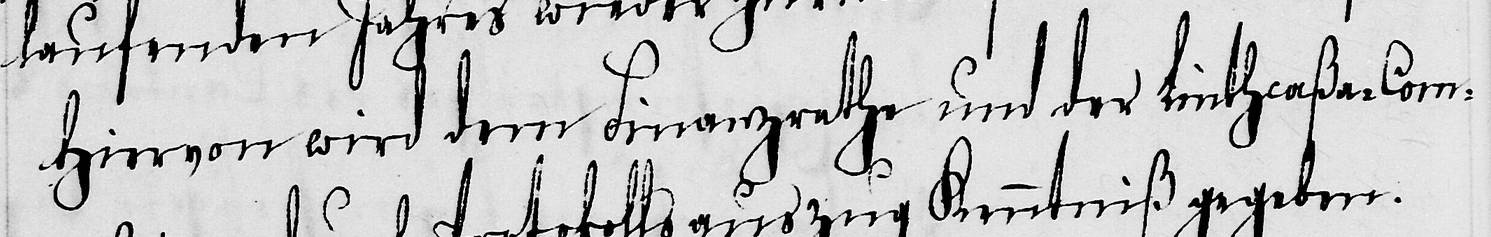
Hiervon wird dem Finanzrathe und der Linthcaßa-Com¬
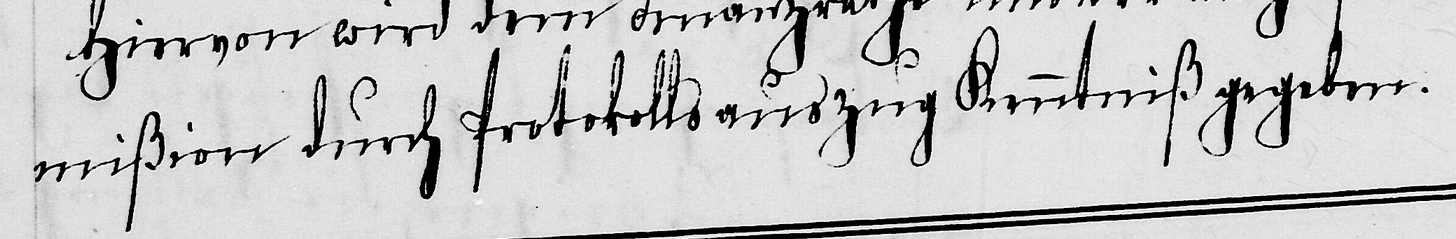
mißion durch Protokollsauszug Kenntniß gegeben.
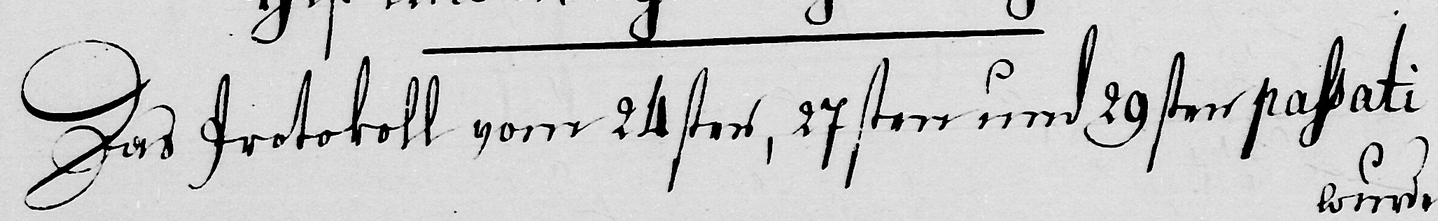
Das Protokoll vom 24ste, 27sten und 29sten passati
